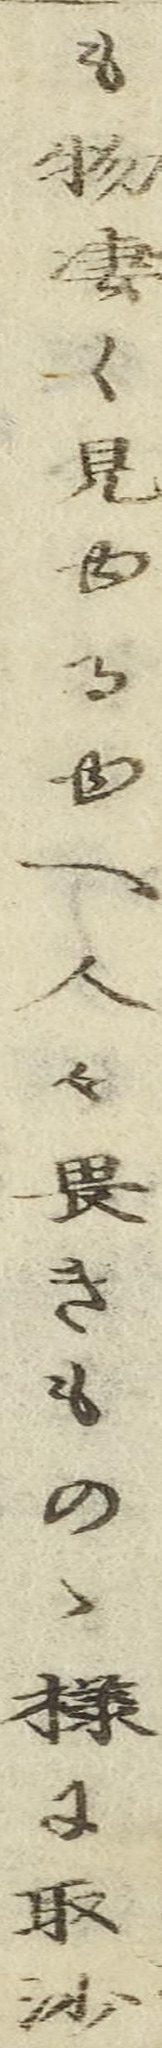も物凄く見ゆるゆへ人々畏きものゝ様に取沙
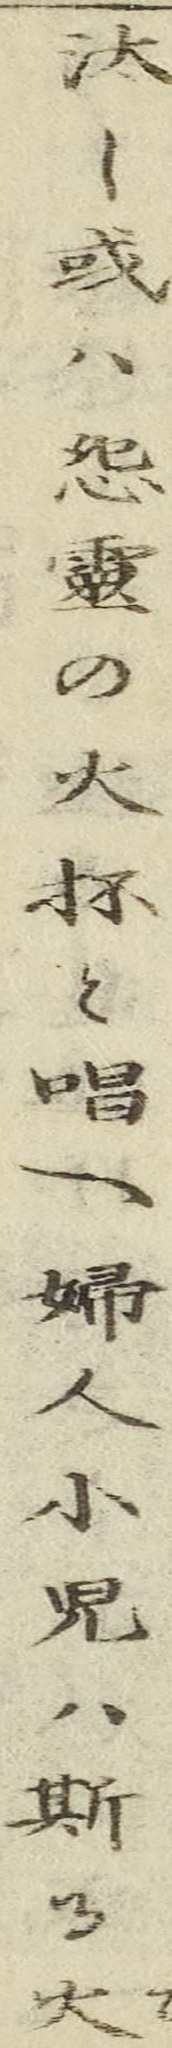汰し或は怨霊の火抔と唱へ婦人小児は斯る火
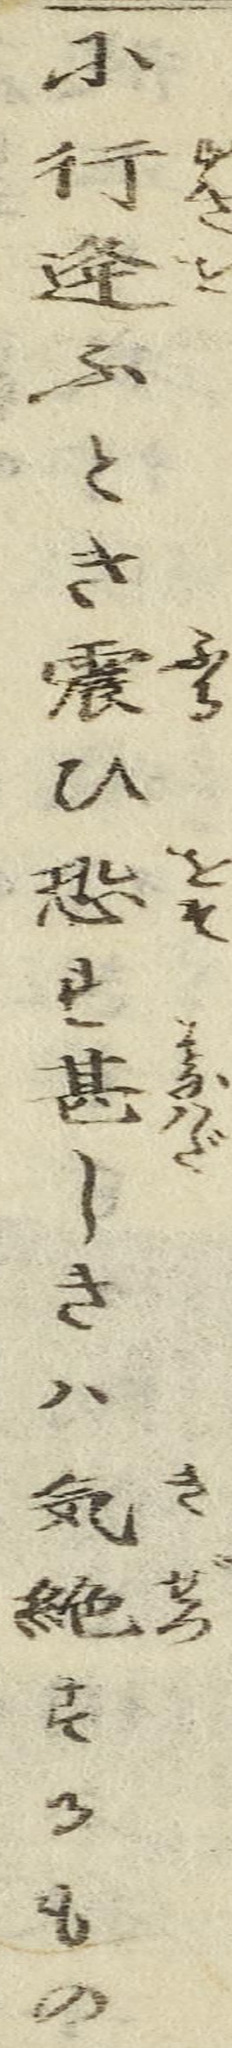に行逢ふとき震ひ恐れ甚しきは気絶するもの
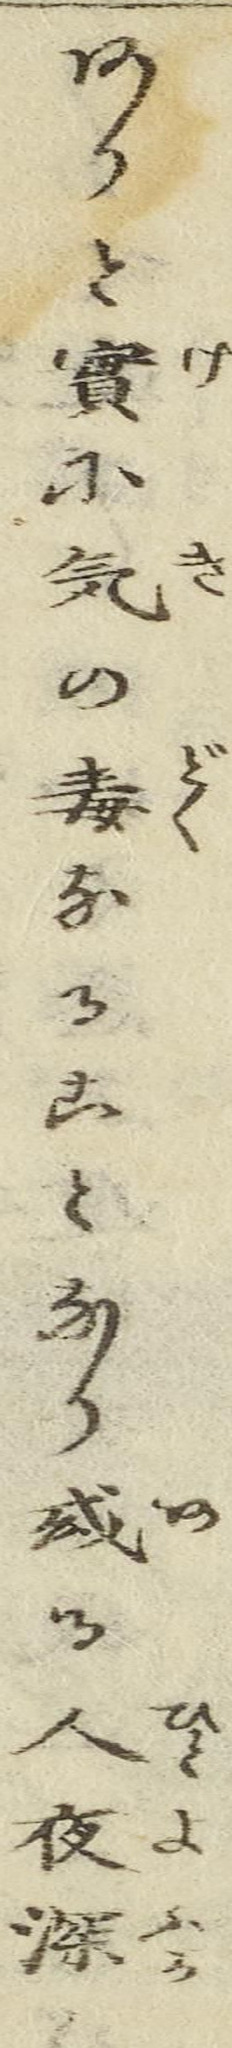ありと実に気の毒なることなり或る人夜深く
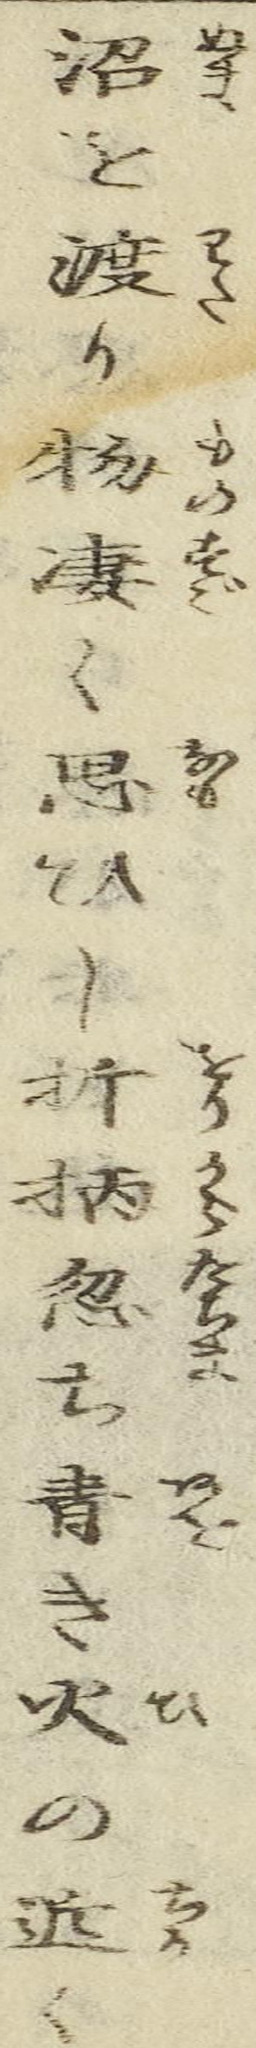沼を渡り物凄く思ひし折柄忽ち青き火の近く
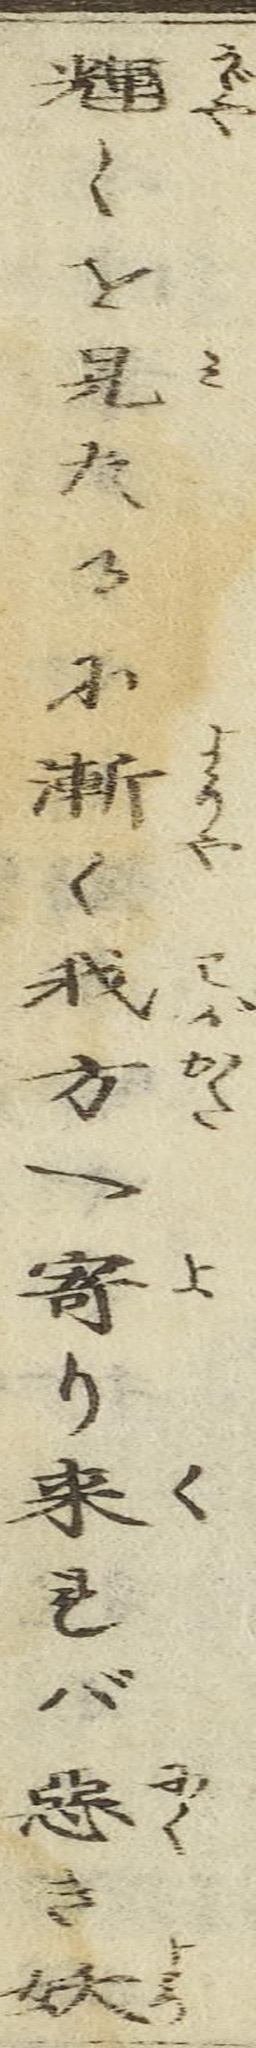輝くを見たるに漸く我方へ寄り来れば悪き妖

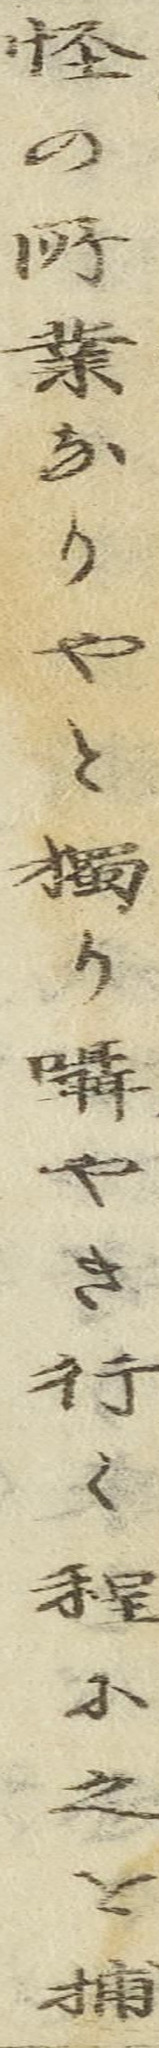怪の所業なりやと独り囁やき行く程に之を捕
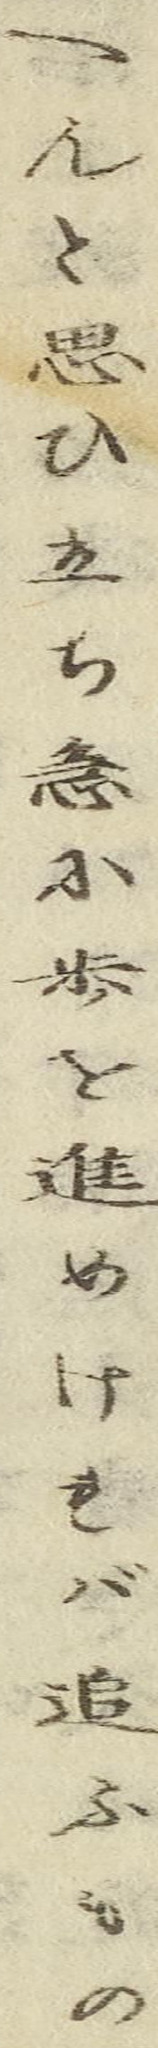へんと思ひ立ち急に歩を進めければ追ふもの
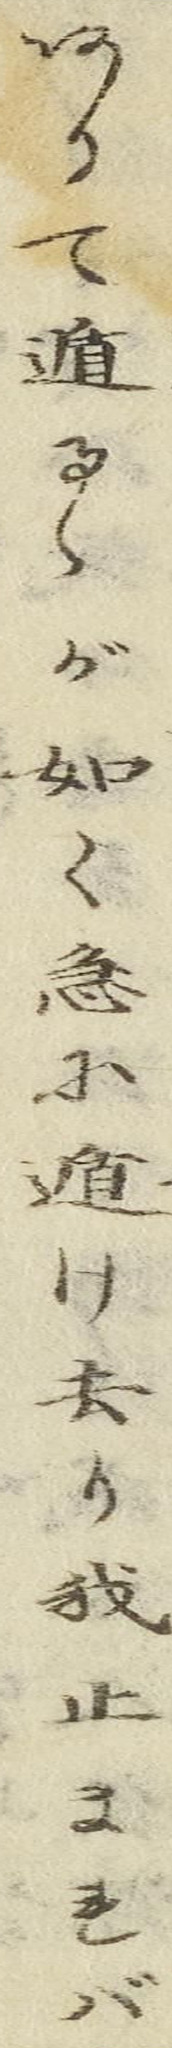ありて遁るゝが如く急に遁け去り我止まれば
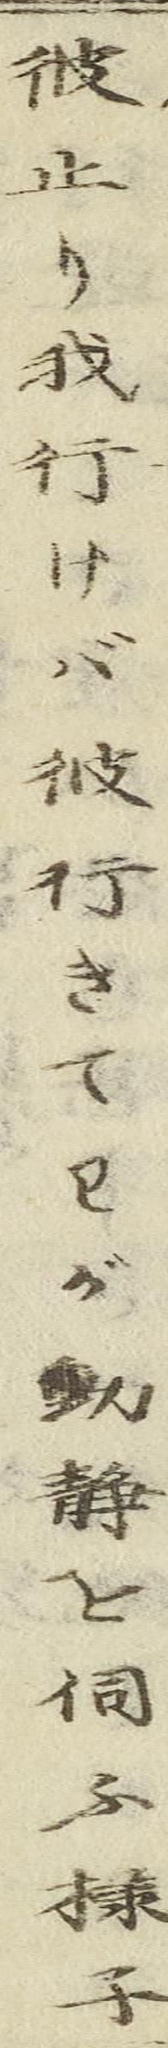彼止り我行けば彼行きてわが動静を伺ふ様子
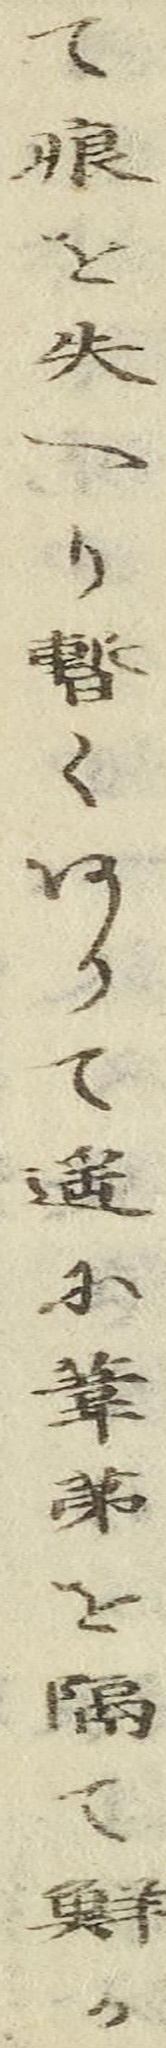て痕を失へり暫くありて遥に葦茅を隔て鮮か
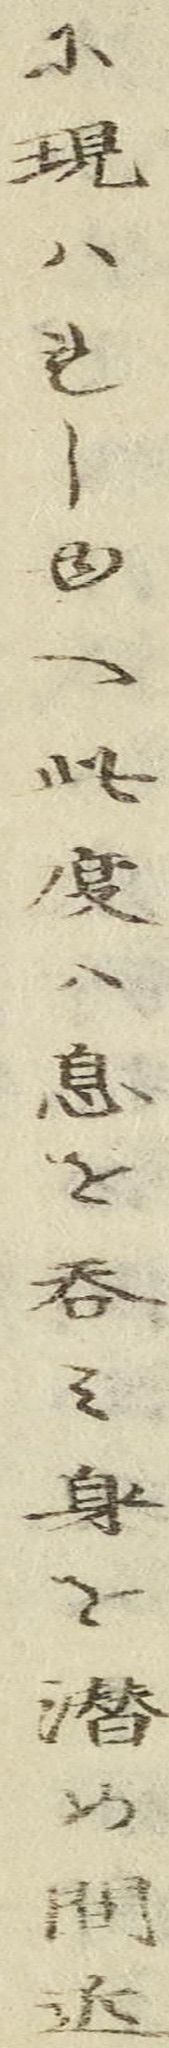に現はれしゆへ此度は息を呑み身を潜め間近
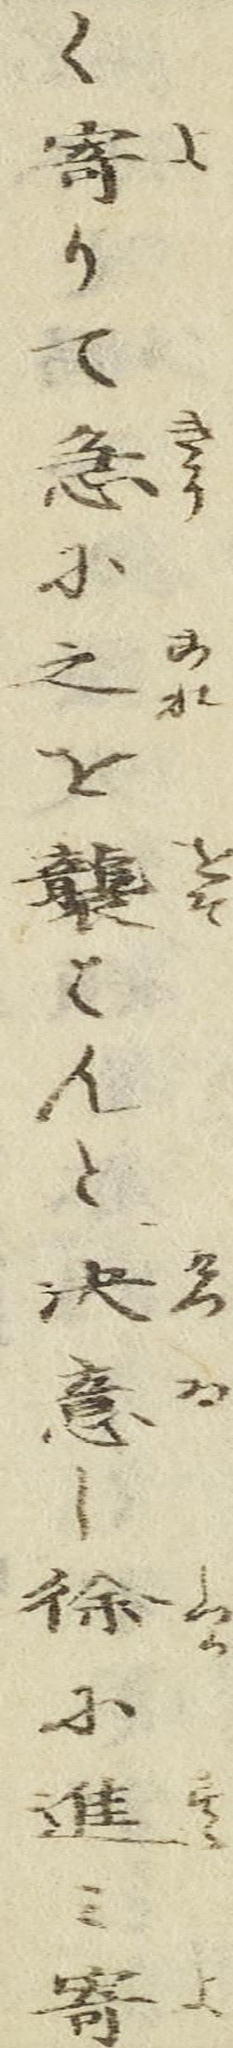く寄りて急に之を襲はんと決意し徐に進み寄
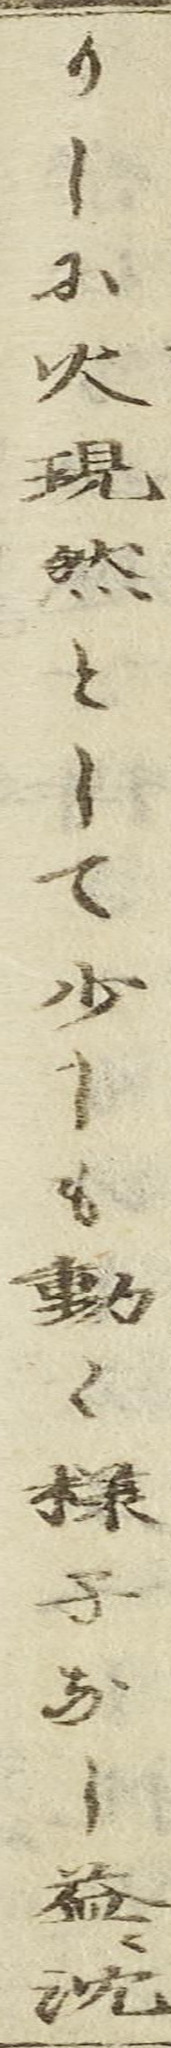りしに火厳然として少しも動く様子なし益〻沈
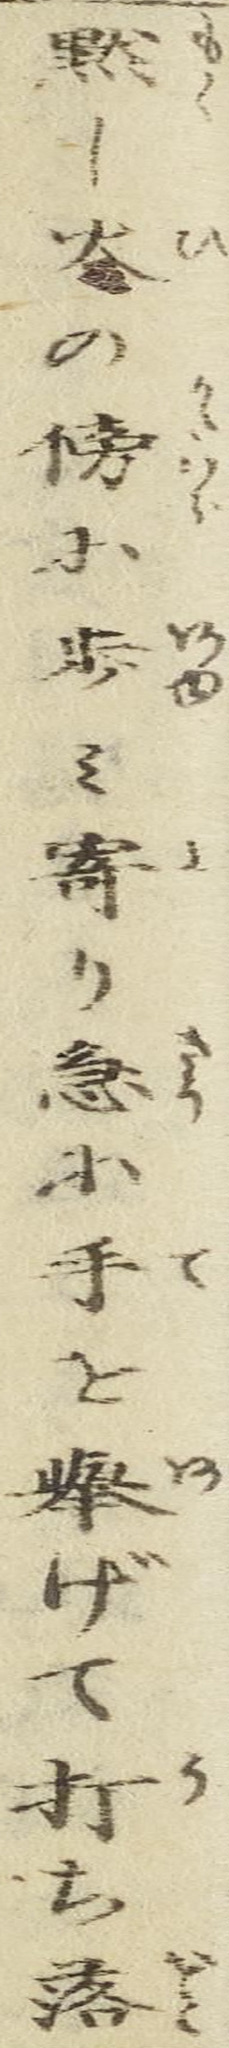黙し火の傍に歩み寄り急に手を挙げて打ち落
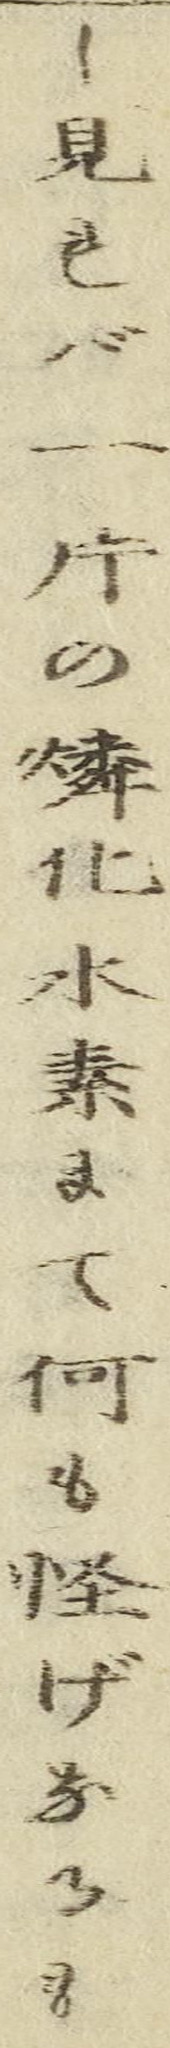し見れば一片の燐化水素にて何も怪げなるも
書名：天変地異
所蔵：東京大学地震研究所図書室 Earthquake Research Institute Library, The University of Tokyo, JAPAN
